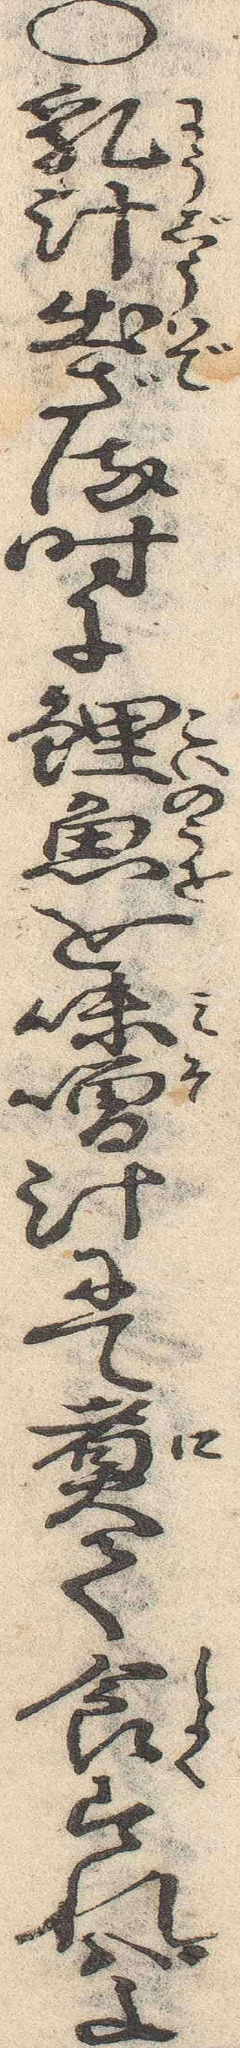◯乳汁出ざる時に鯉魚を味噌汁にて煑て食すればよ
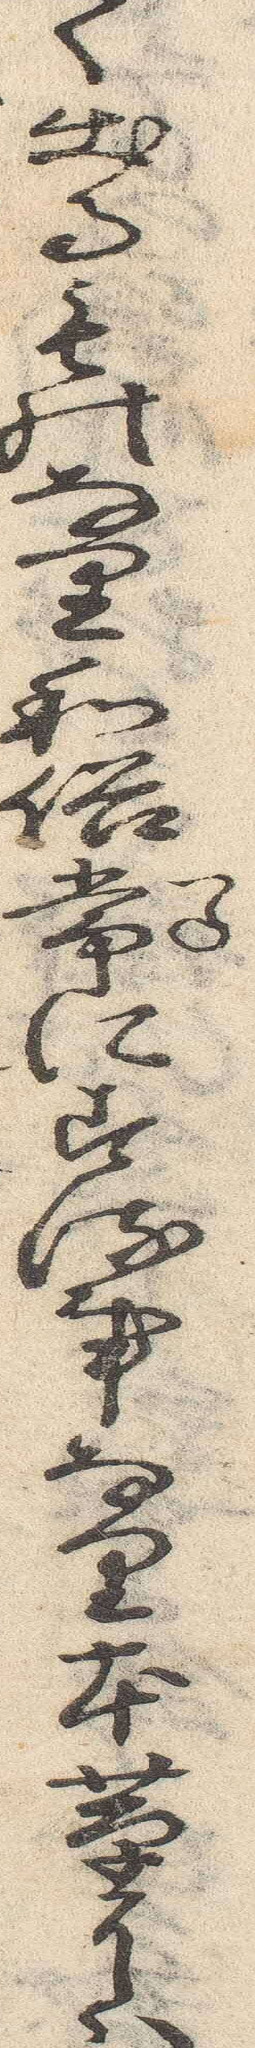く出るものなり和俗常にする事なり本草には
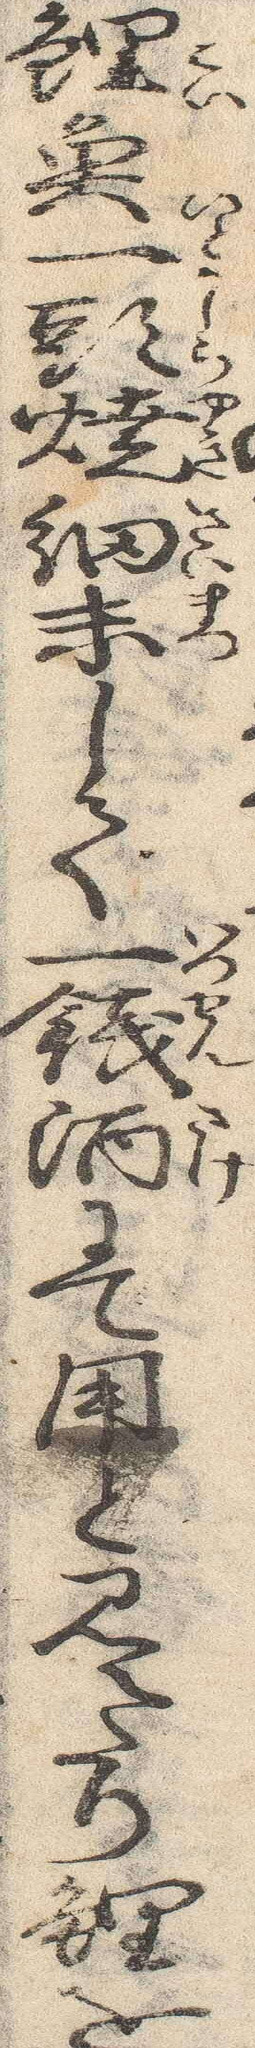鯉魚一頭焼細末して一銭酒にて用と見えたり鯉を
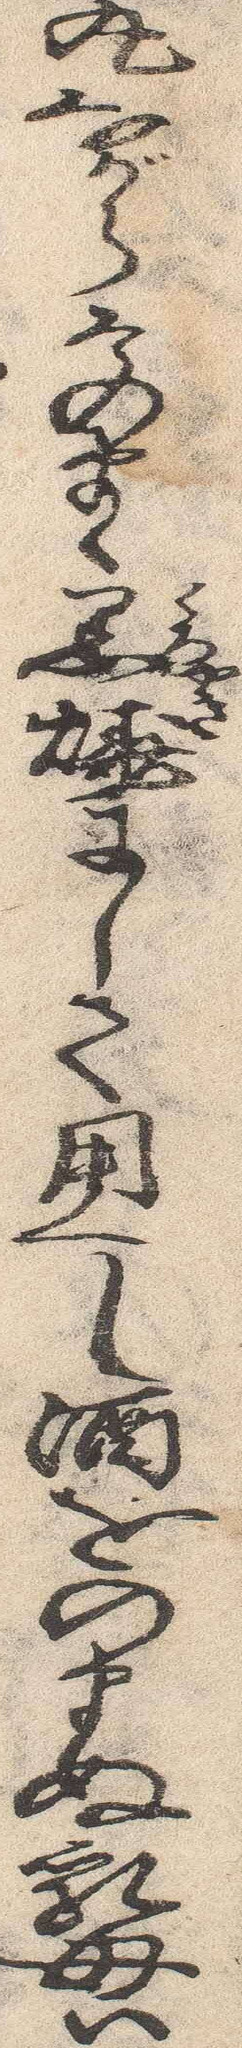丸ながらそのまゝ黒焼にして用へし酒をのまぬ乳母は
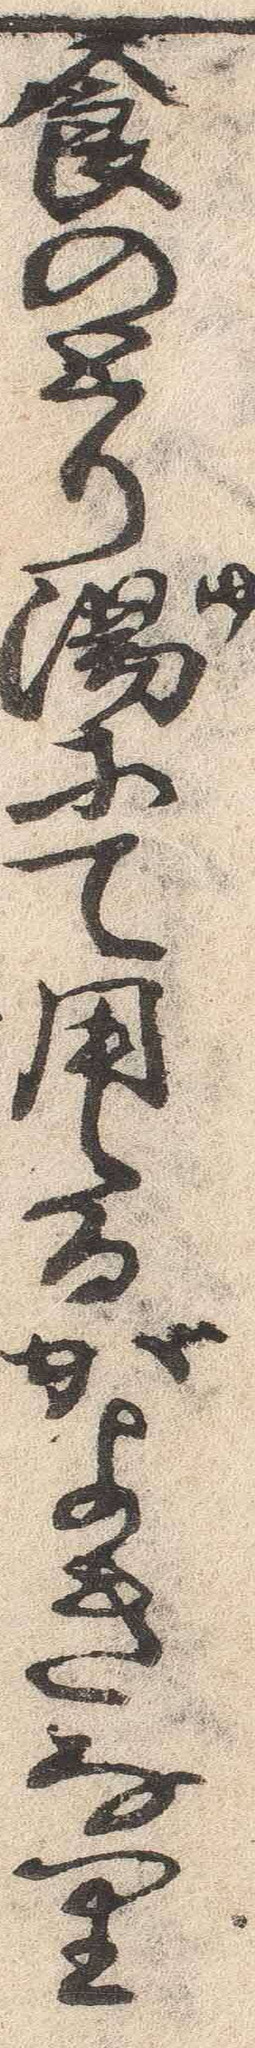食のとり湯にて用たるがよきなり
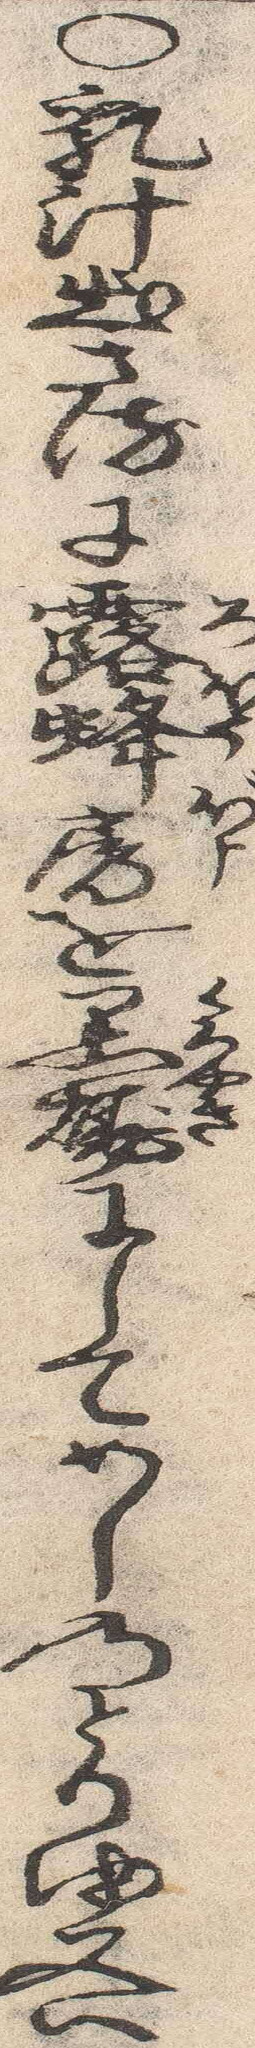◯乳汁出さるに露蜂房を黒焼にしてめしのとりゆ又は
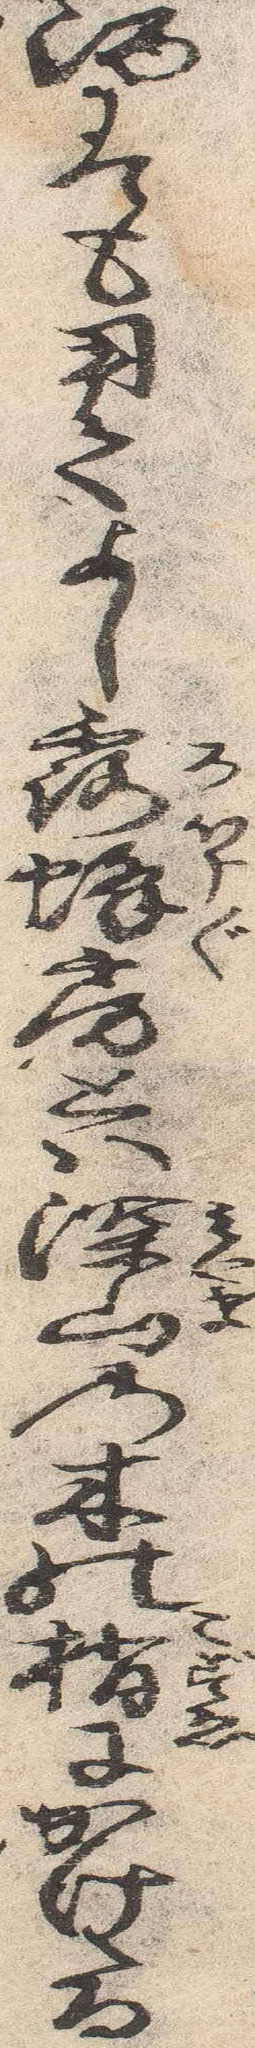酒にても用てよし露蜂房とは深山の木の梢にかけたる
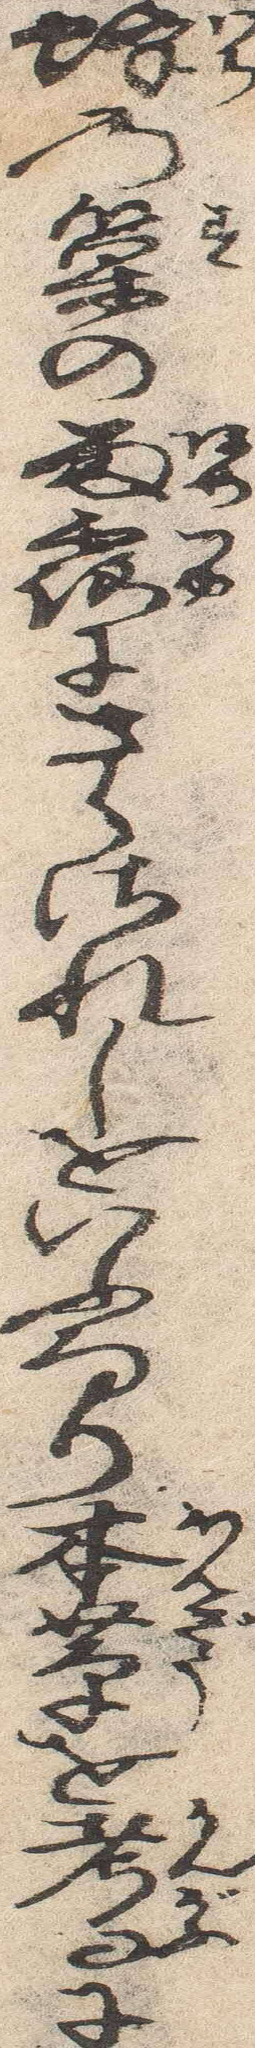蜂の巣の雨露にさらされしをいふなり本草を考るに
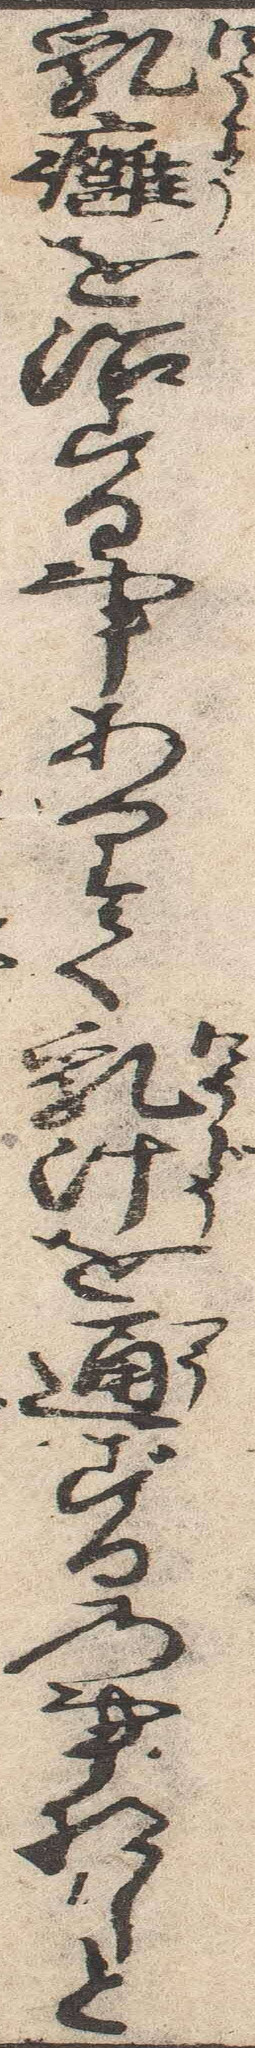乳癰を治する事ありて乳汁を通ずるの事なしと
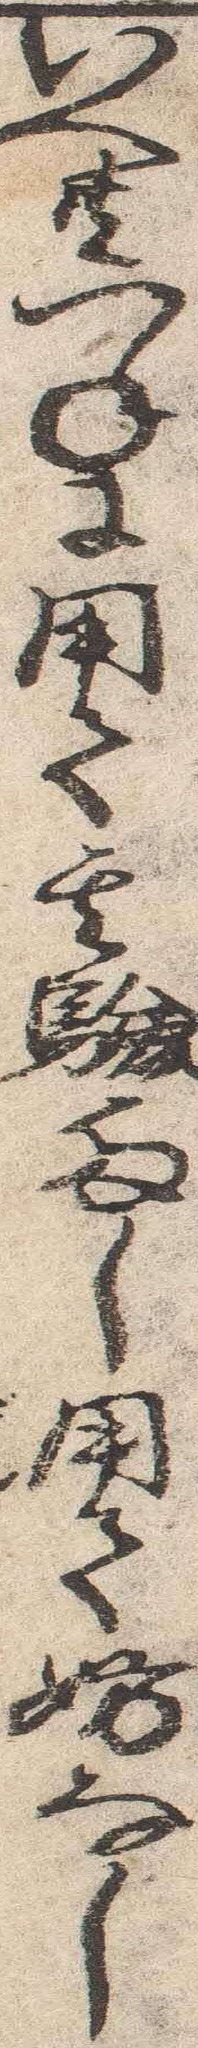いへ共つねに用て其驗多し用て妨なし
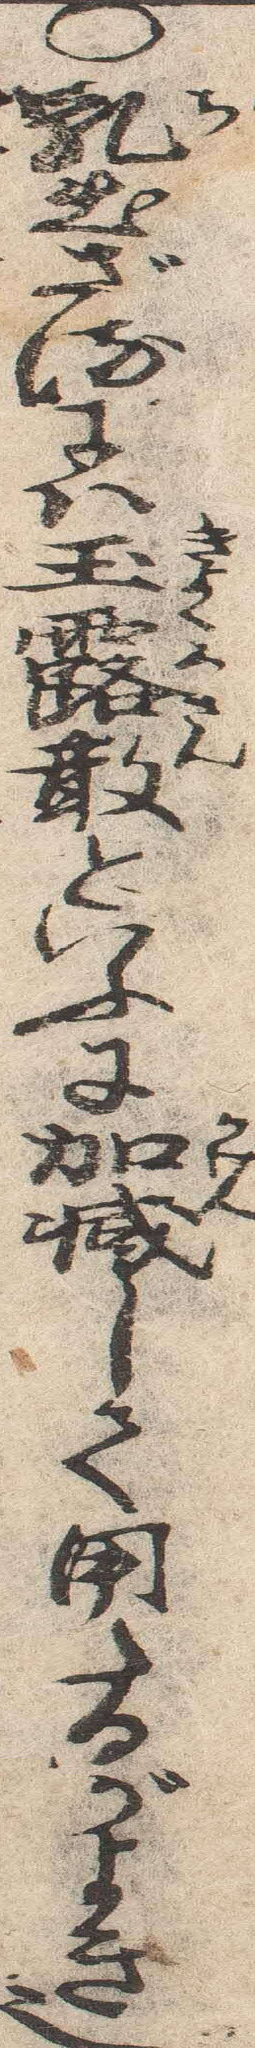◯乳出ざるには玉露散といふに加減して用たるがよき也
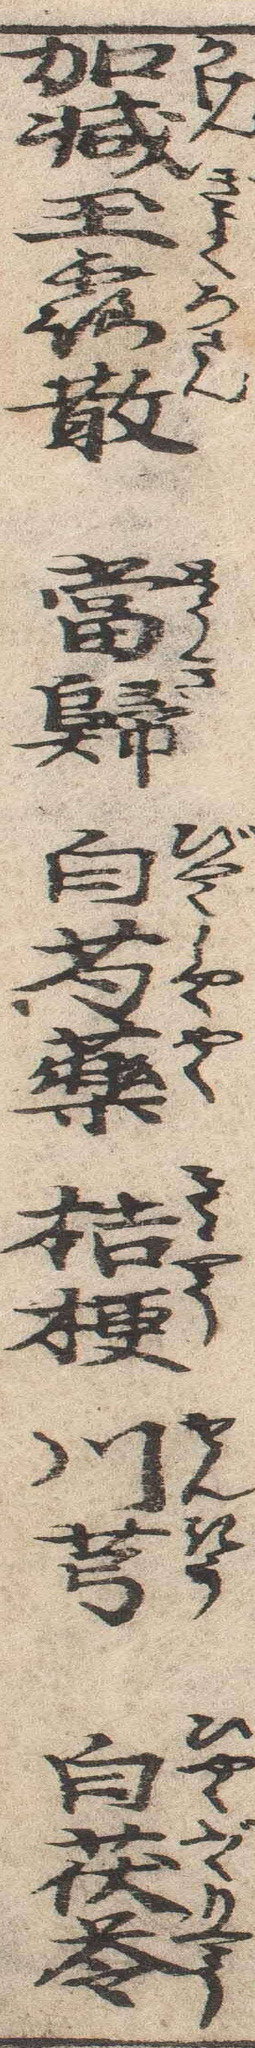加減玉露散当帰白芍藥桔梗川芎白茯苓
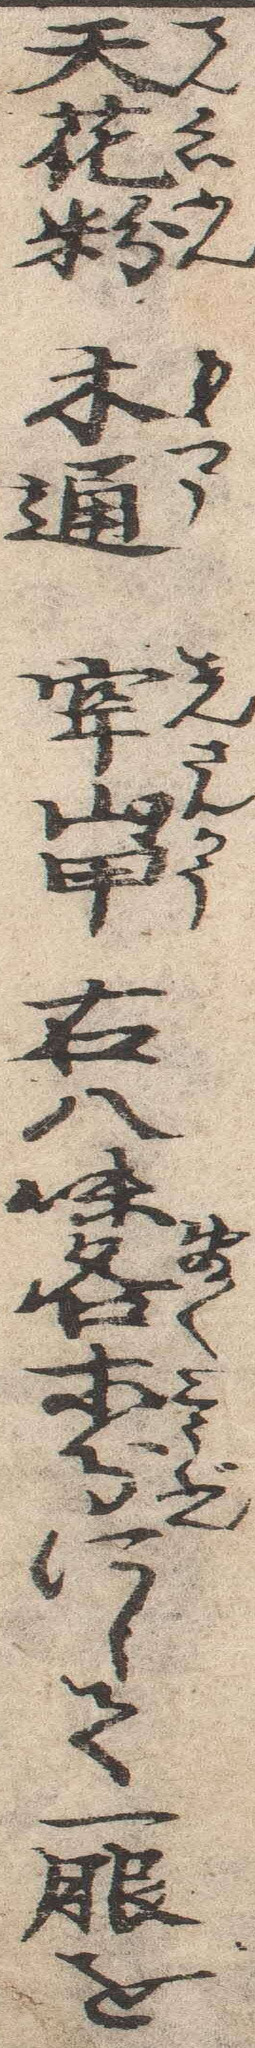天花粉木通穿山甲右八味各等分にして一服を
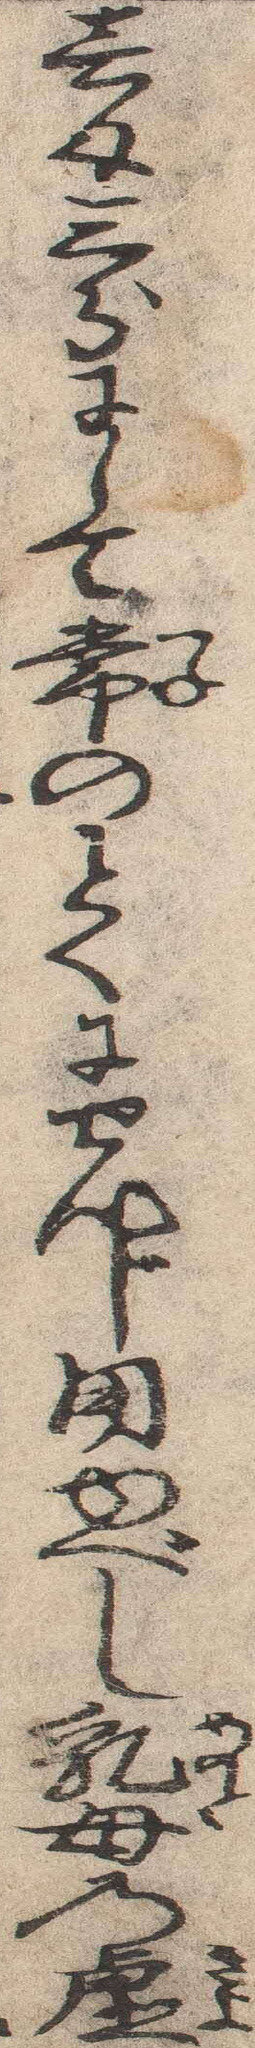壱匁三分にして常のことくにせんじ用ゆべし乳母の虚

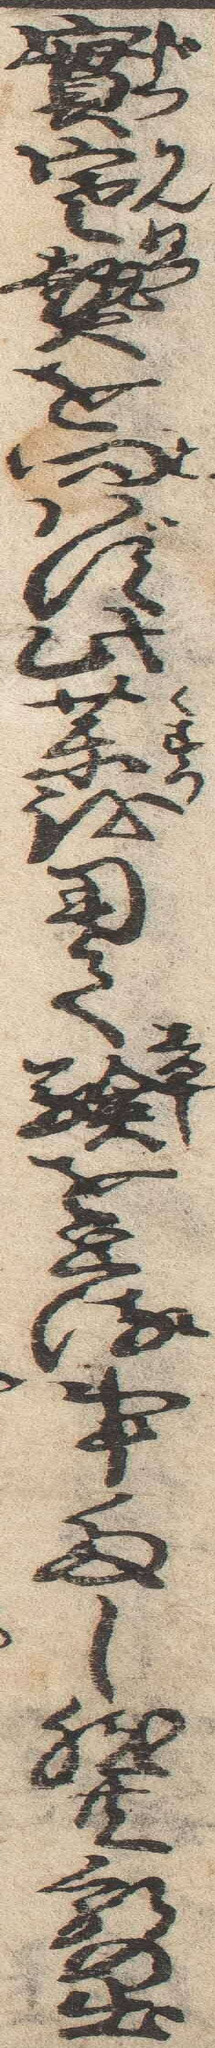實寒熱を問はず此薬を用て験をとる事多し然共乳の出
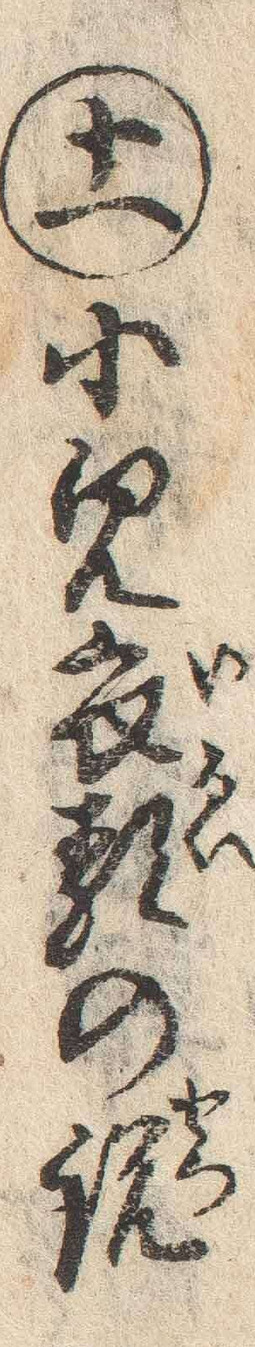十一小児衣類の説
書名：小児必用養育草
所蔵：東京学芸大学附属図書館 国文学研究資料館
